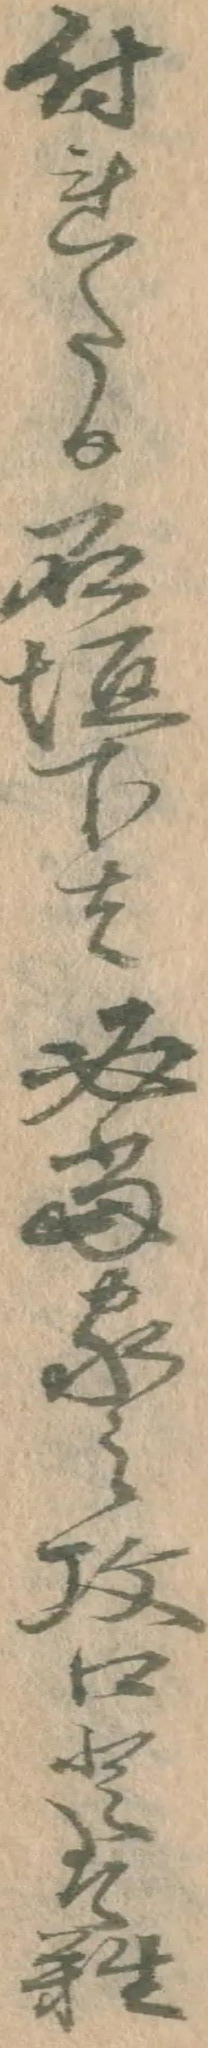付連たる石垣下者必当家之攻口登盤難
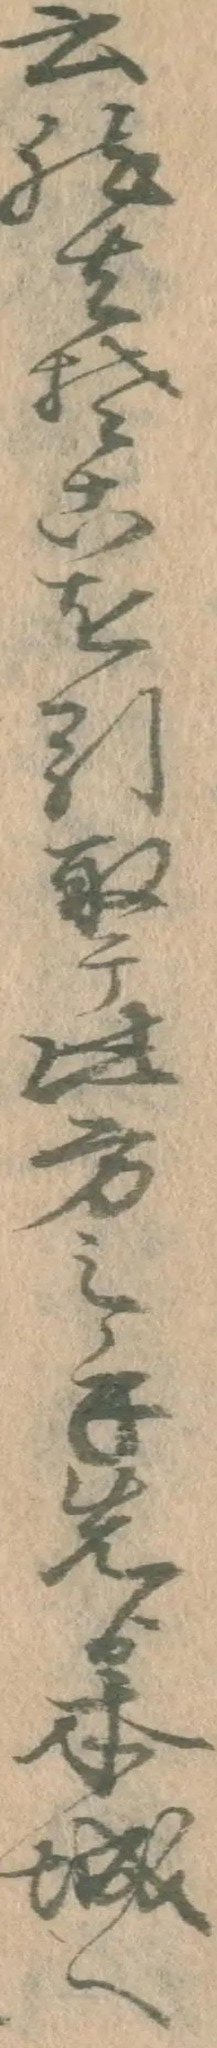云然者楚古を引取て此方之手先ゟ本城へ
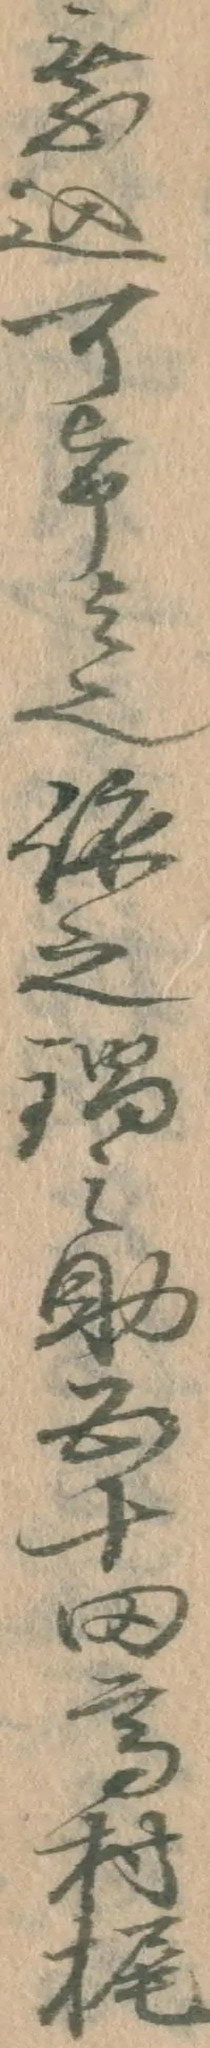乗込可被申与也依之鍋之助五十田高村梶
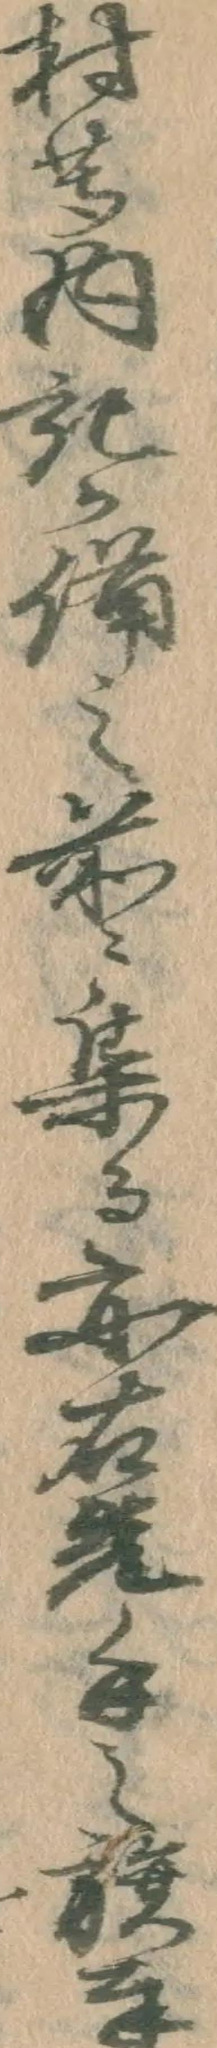村等内記か備之前に集る亦右先手之旗奉
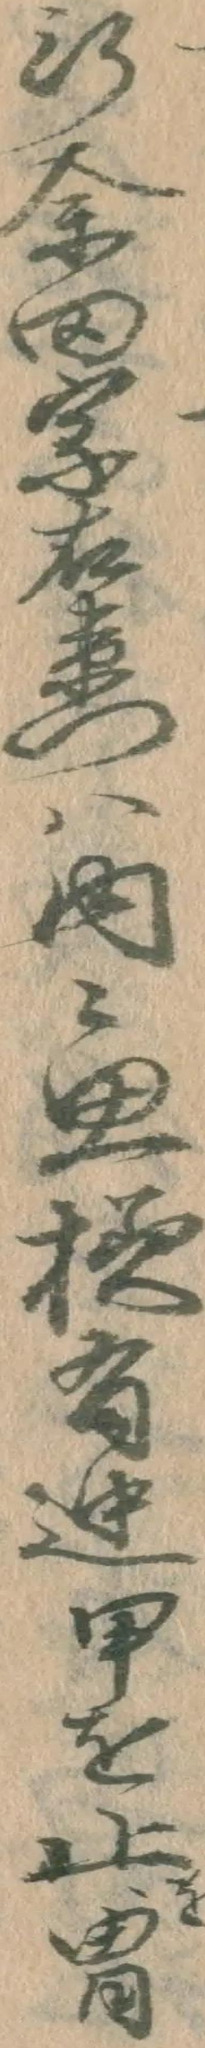行余田宗右衛門は内に思様有迚甲を止冑
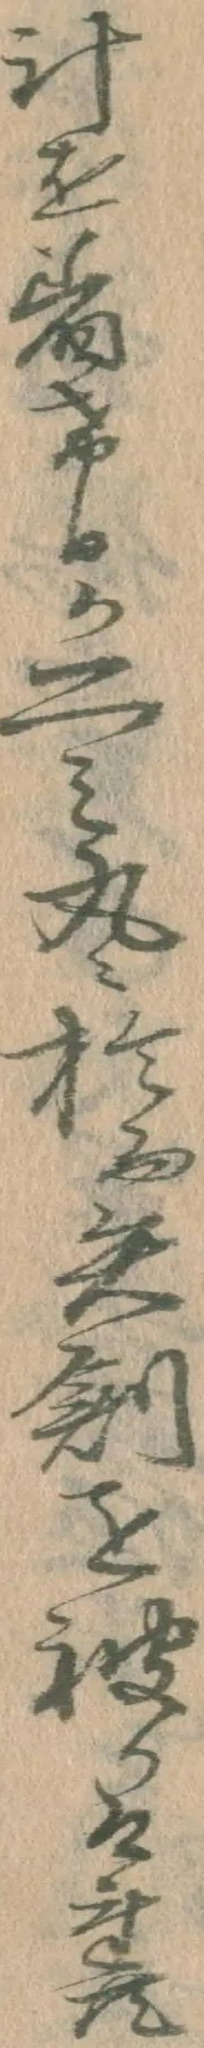斗を着希るか二之丸に於而矢創を被りけ連共
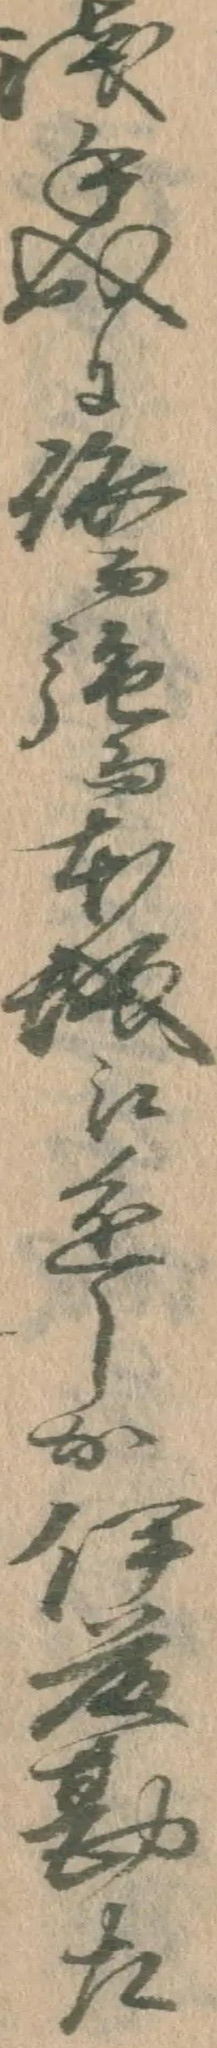浅手成尓依而強而本城江進しか伊藤勘左
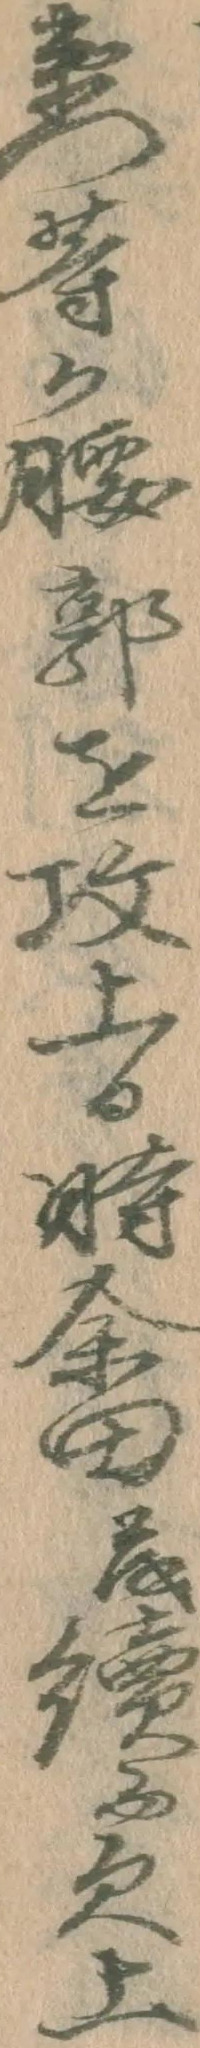衛門等か腰郭を攻上る時余田茂続而欠上
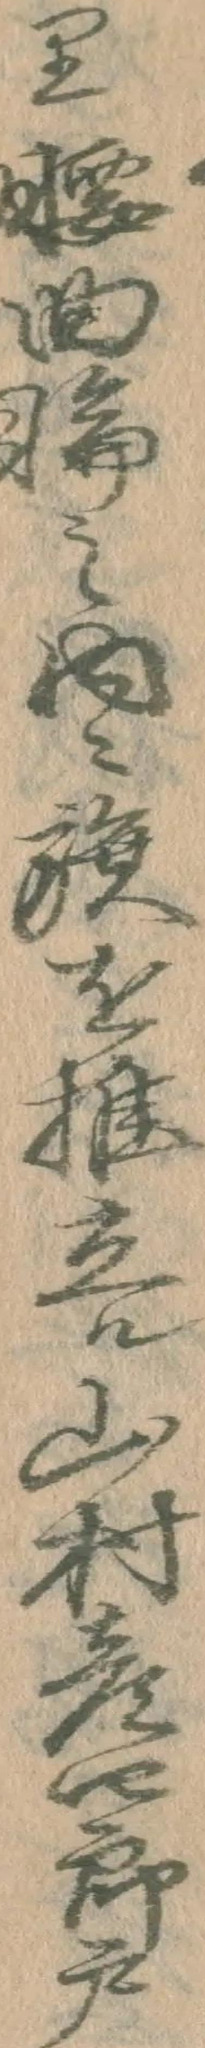里腰曲輪之内に旗を推立る山村彦四郎戸
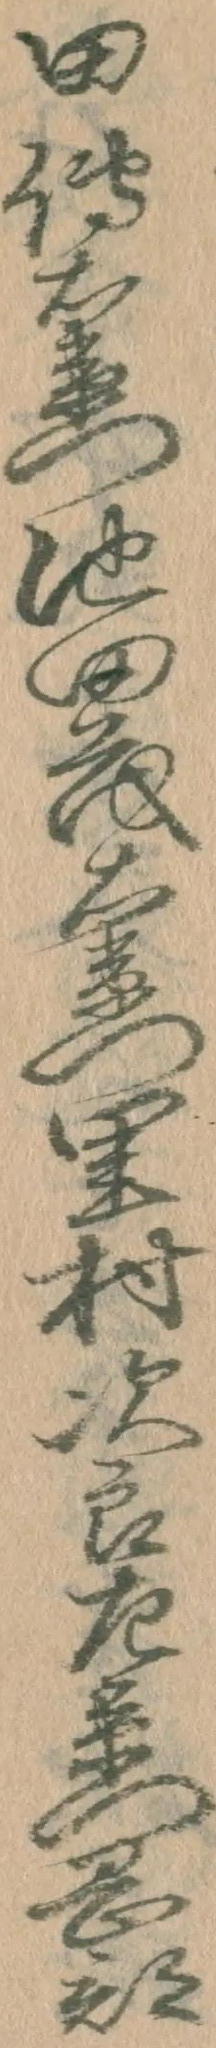田伝右衛門池田茂右衛門里村次郎左衛門岡部
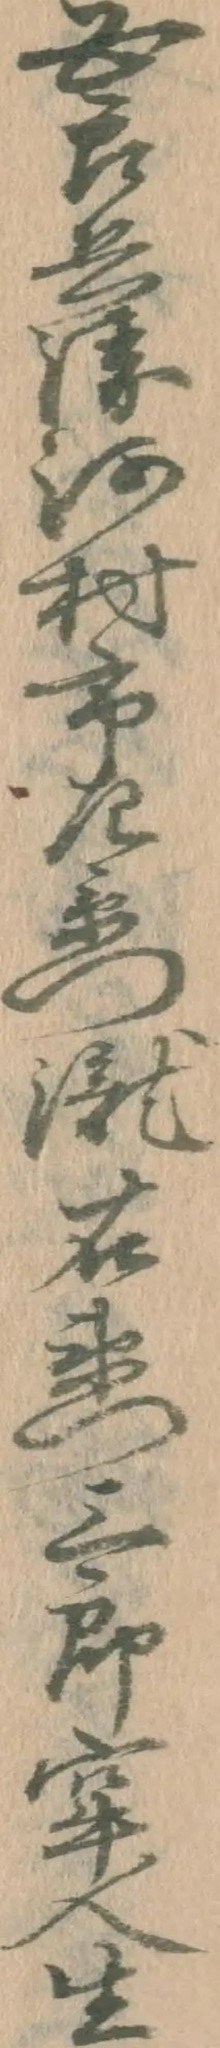五郎兵衛河村市左衛門瀧右衛門三郎牢人生
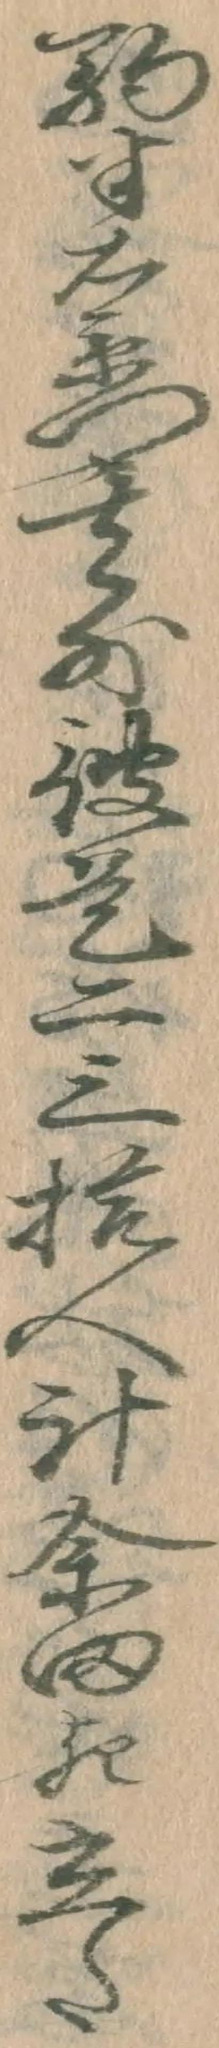駒半右衛門其外彼是ニ三拾人斗余田歟立た
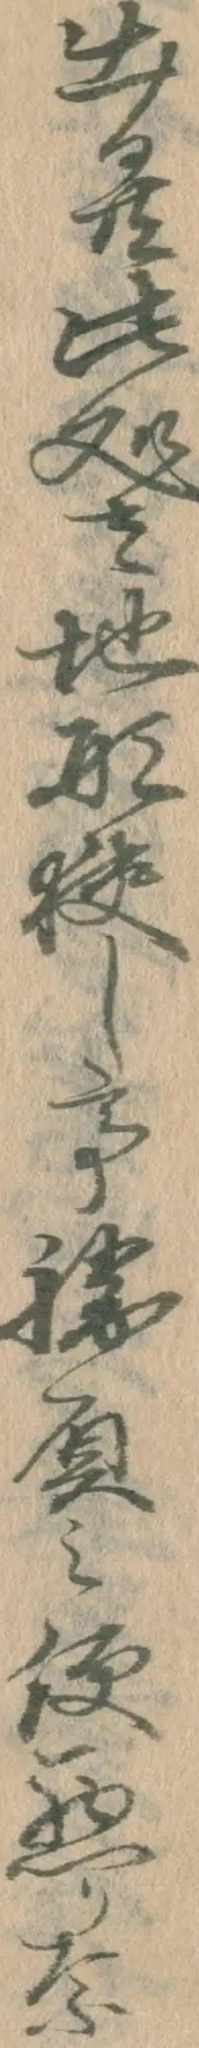出る共此処者地形狭し亭勝負之便悪り奈
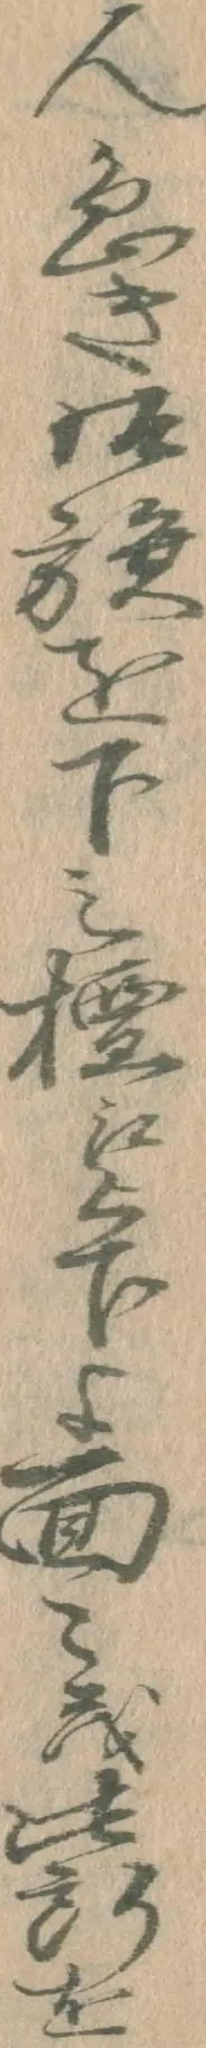ん急き御旗を下之檀江被下よ面に茂此所を被
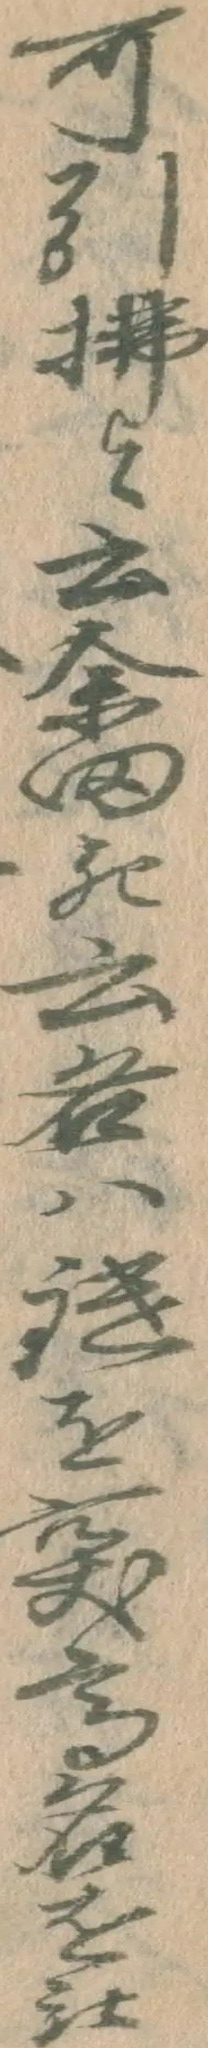可引払与云余田歟云各は鑓を突亭名を被
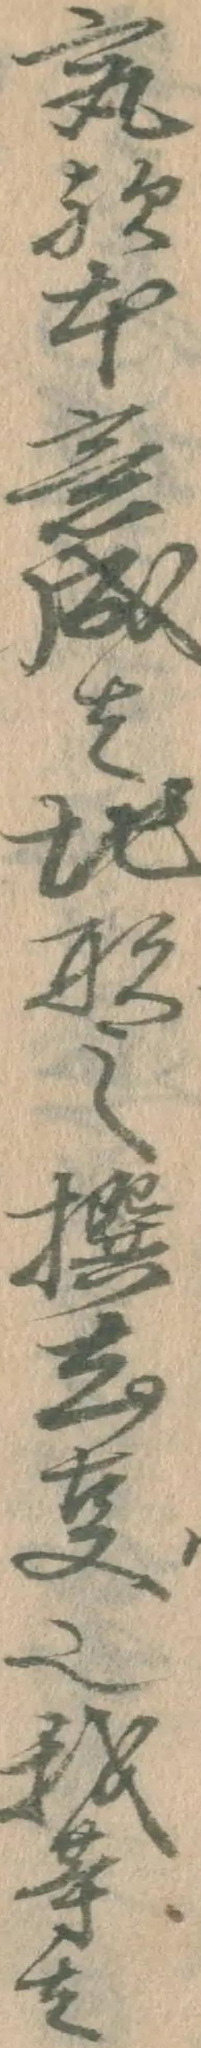究歟本意成者地形之撰去事也我等者
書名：切支丹御退治記 49巻. [8]
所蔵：国立国会図書館 National Diet Library, JAPAN
